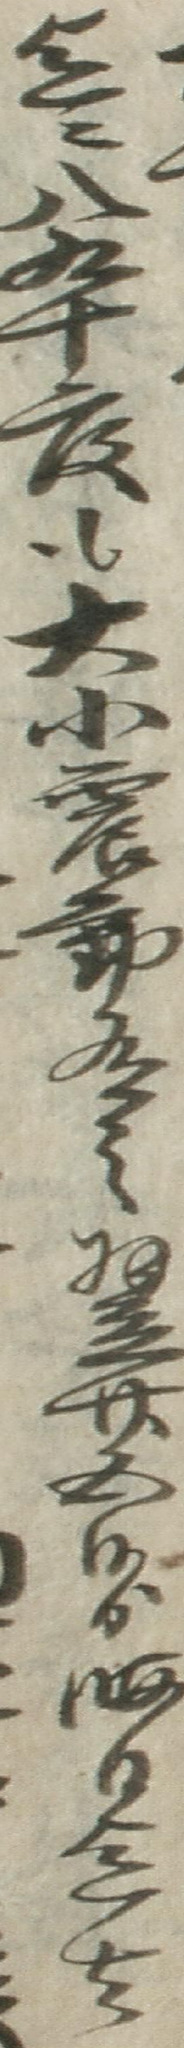迄二八九十度ッゝ大小震動有之翌廿五日ゟ晦日迄は
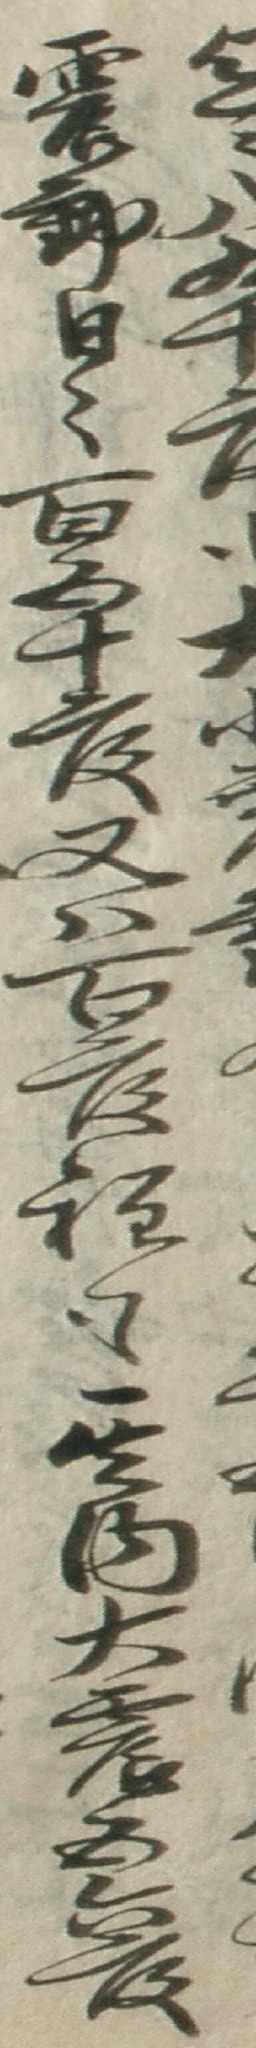震動日々百五十度又ハ百度程ッゝ其内大震五六度
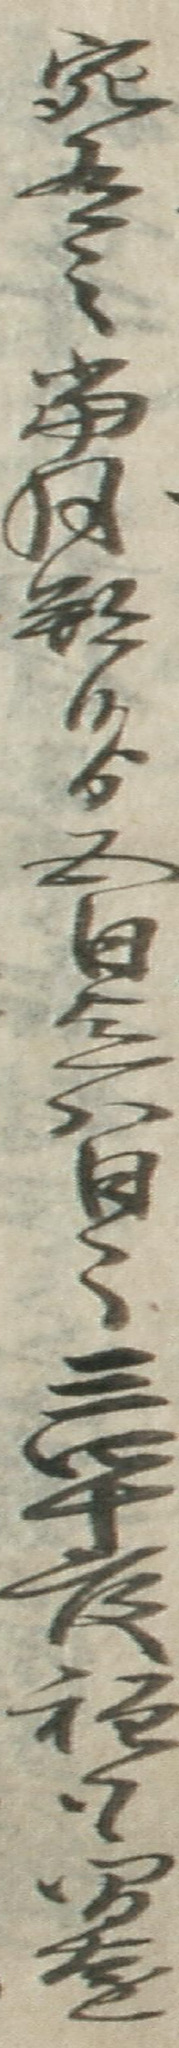宛有之当月朔日ゟ五日迄ハ日々三四十度程ッゝ間遠
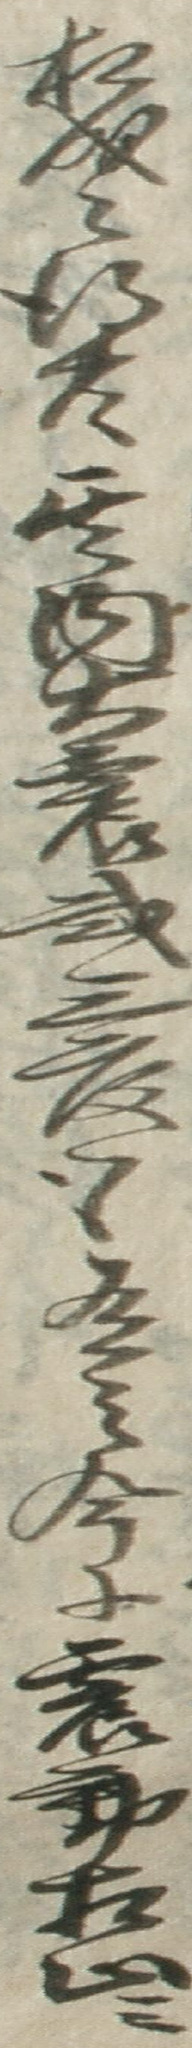相成候得共其内大震弐三度ッゝ有之今二震動相止ミ
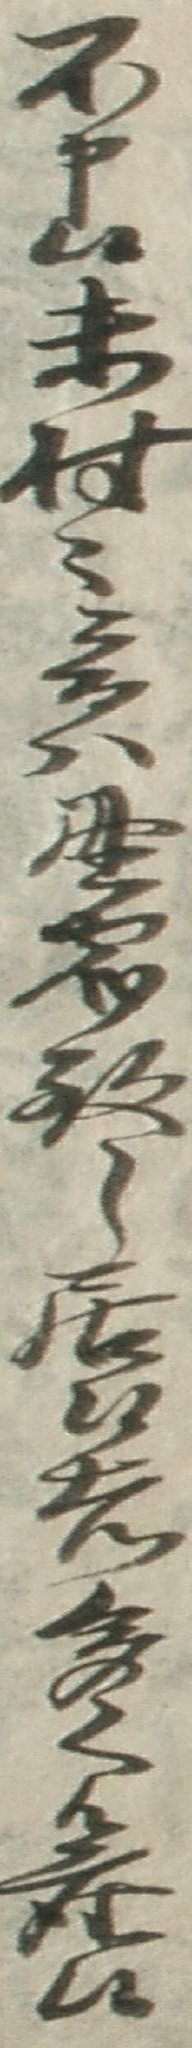不申候未村々二而野宿致し居候者多く御座候
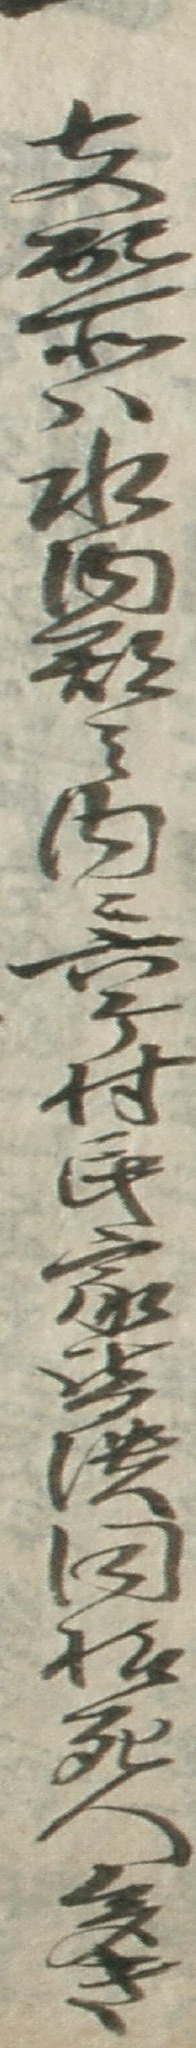一支配所ハ水内郡之内二六ヶ村民家皆潰同様死人多き
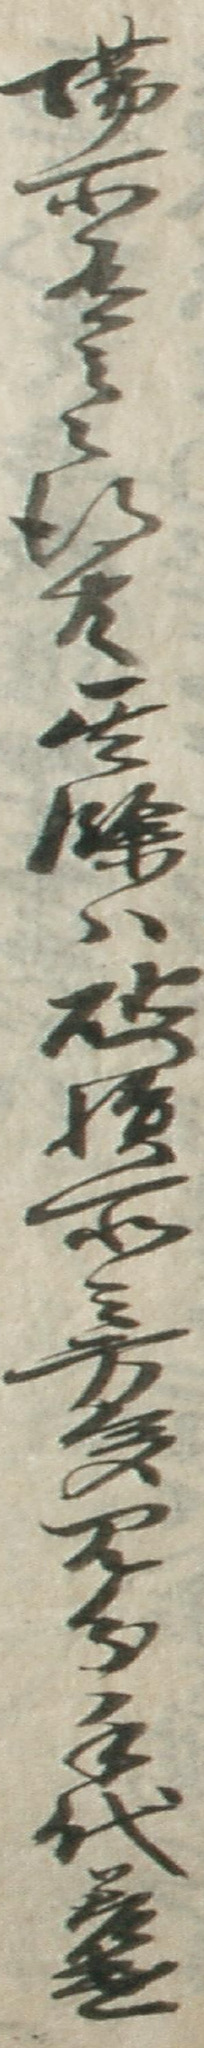場所有之候得共其餘ハ破損所々方多見分手代差遣

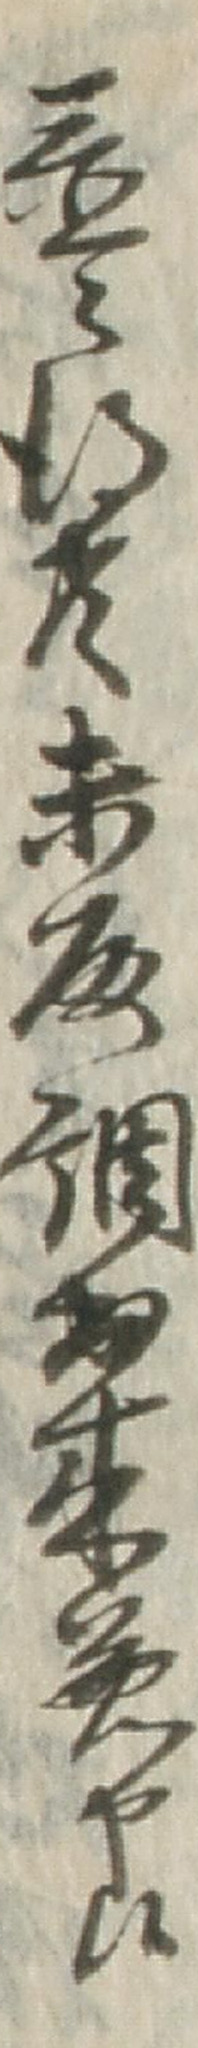置候得共未取調出来兼申候
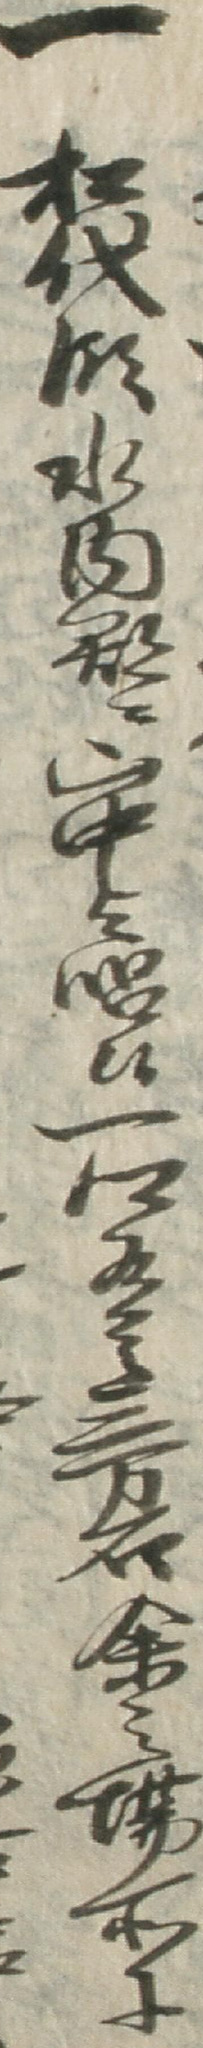一松代領水内郡二山中と唱候一郷有之三万石余之場所に
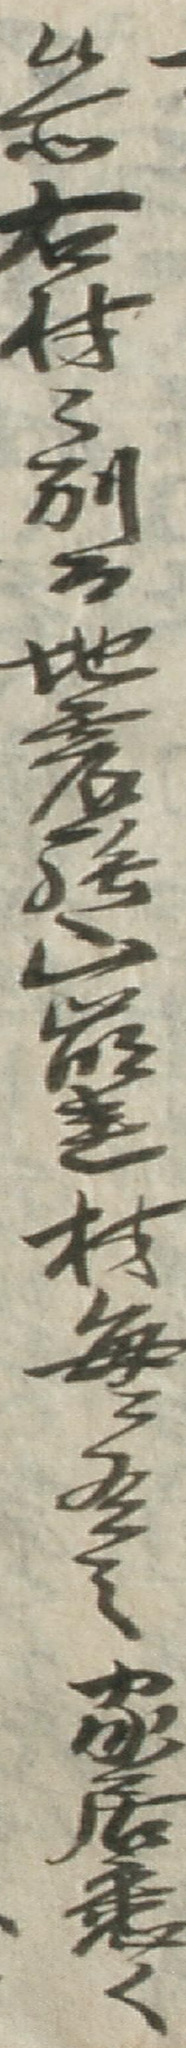候所右村々別而地震強山崩れ村毎二有之家居悉く
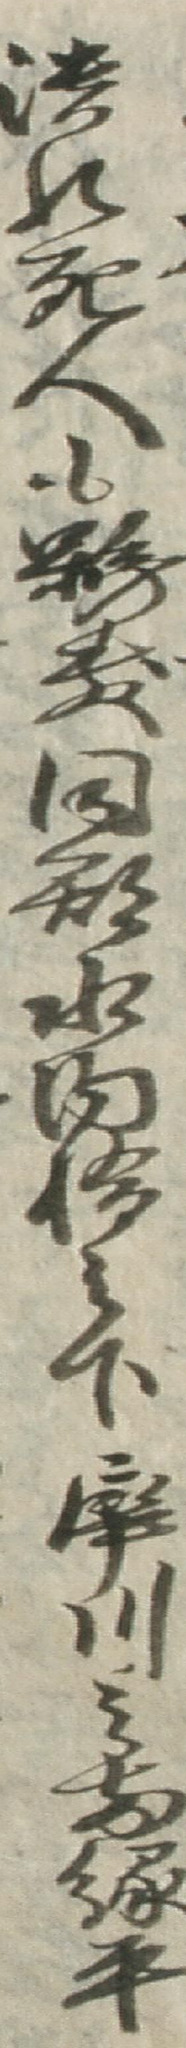潰れ死人も夥敷同郡水内橋之下犀川之両縁平
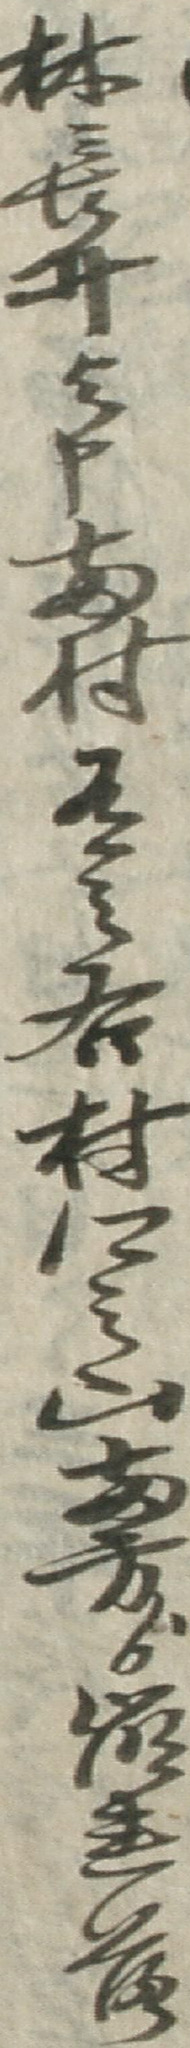林長井と申両村有之右村郷之山両方ゟ崩れ落
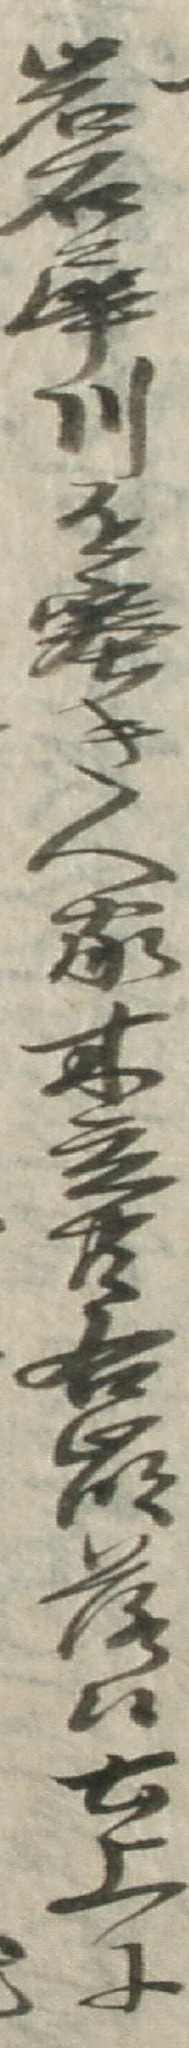岩石犀川を塞き人家木立共右崩落候土上に
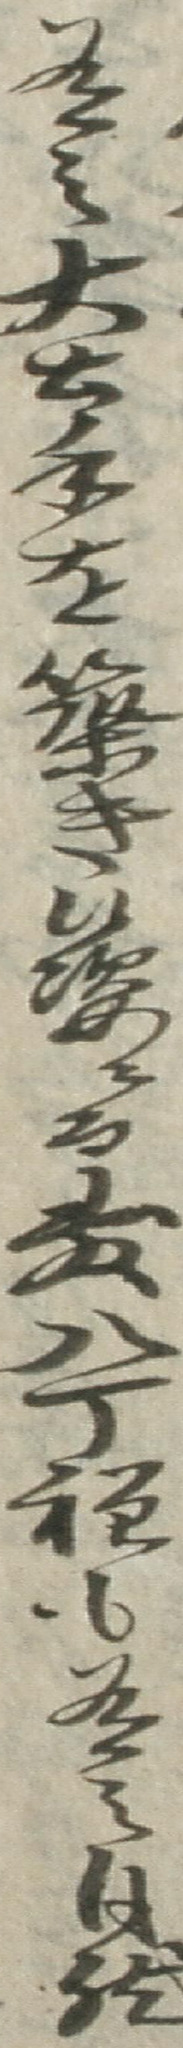有之大土手を築き候姿二而敷八丁程も有之自然
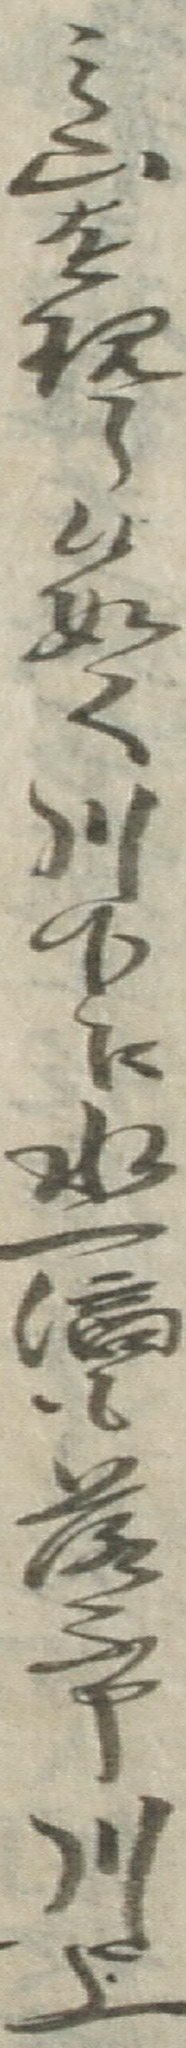之山を現し候如く川下へ水一滴も落不申川上
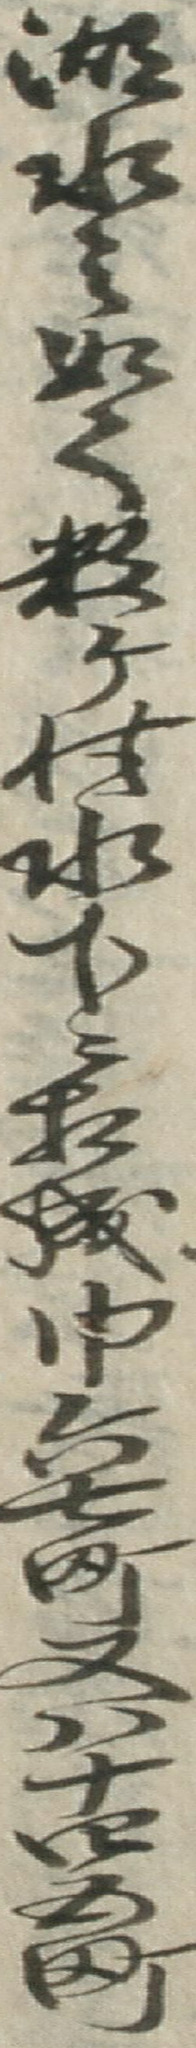湖水の如く数ヶ村水下二相成巾六七町又ハ十四五町
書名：信濃國地震實録記
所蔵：東京大学地震研究所図書室 Earthquake Research Institute Library, The University of Tokyo, JAPAN
